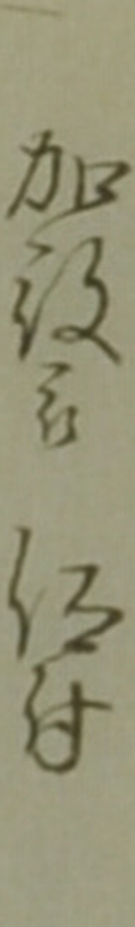加役被仰付
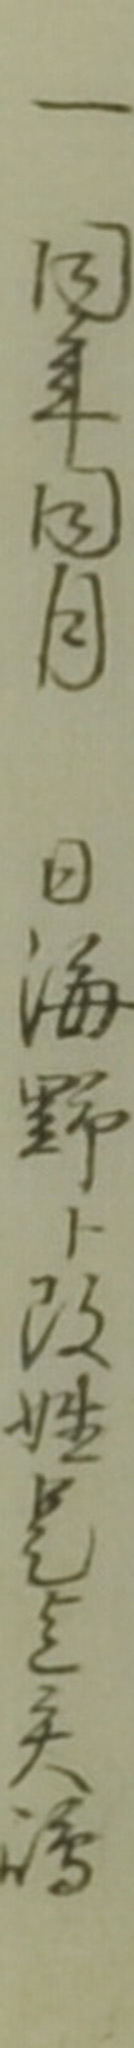一同年同月日海野ト改姓是迄矢嶋
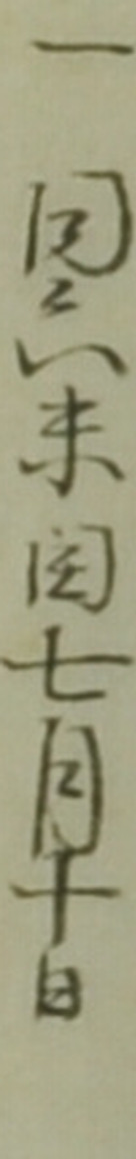一同六未閏七月十日

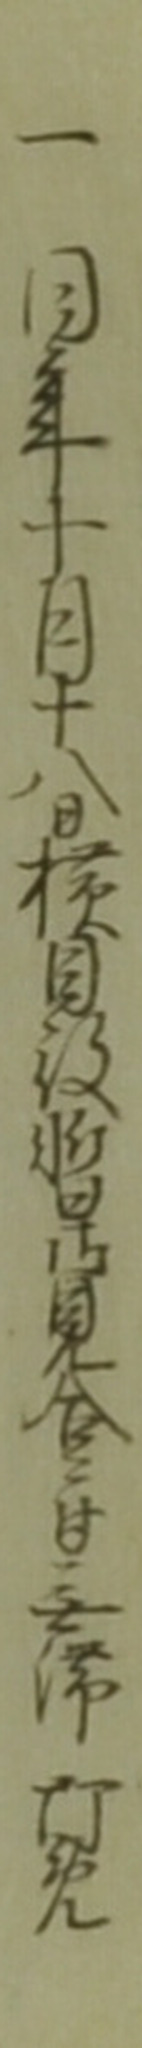一同年十月十八日横目役暫御見合ニ付無滞御免
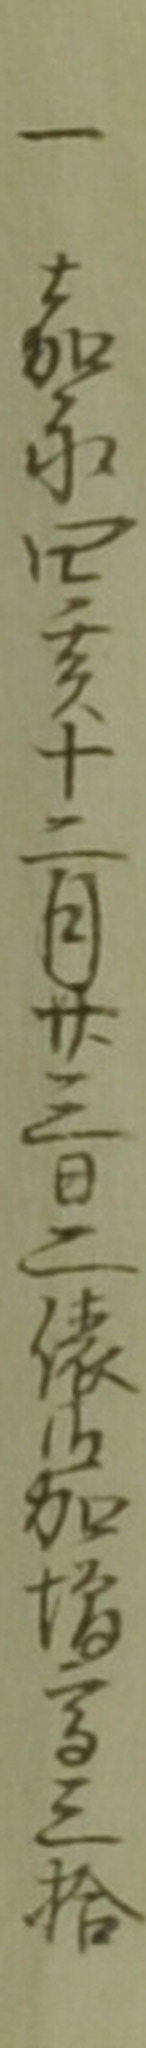一嘉永四亥十二月廿三日二俵御加増高三拾
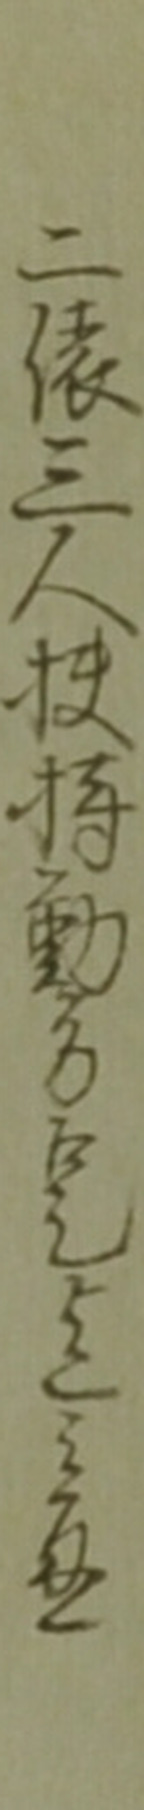二俵三人扶持勤方是迄之通
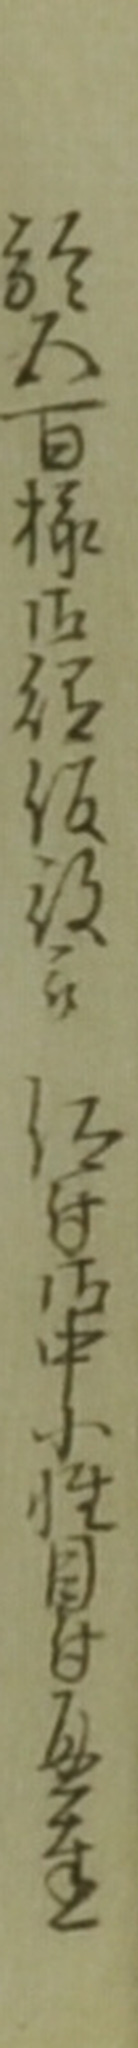於五百様御賄仮役被仰付御中小性目付通達
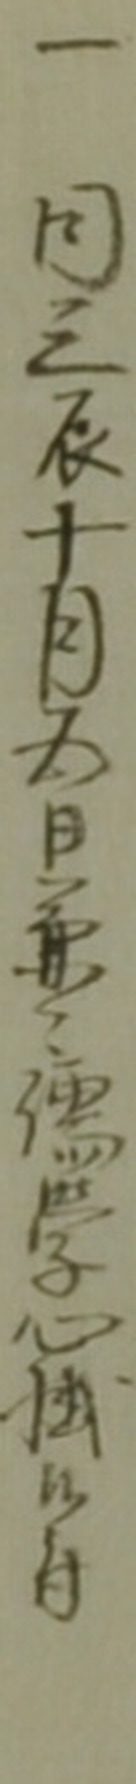一同三辰十月五日兼々儒学心掛候付
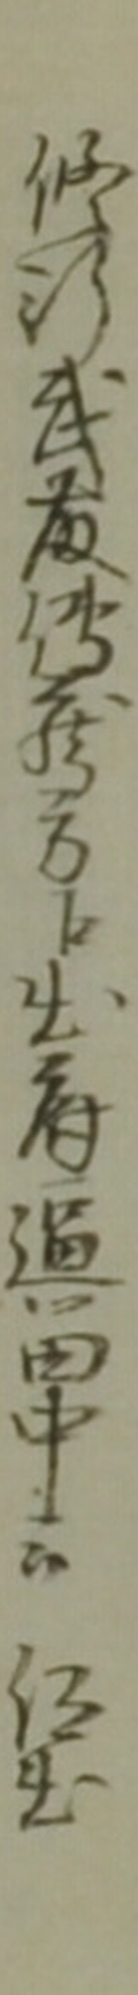修行武藤伝蔵方江出府逼留中被仰出
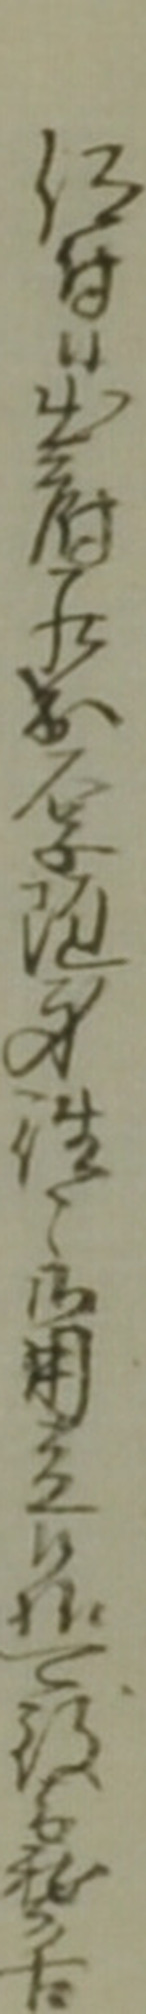仰付候出府罷出厚随身往々御用立候様可致旨稽古
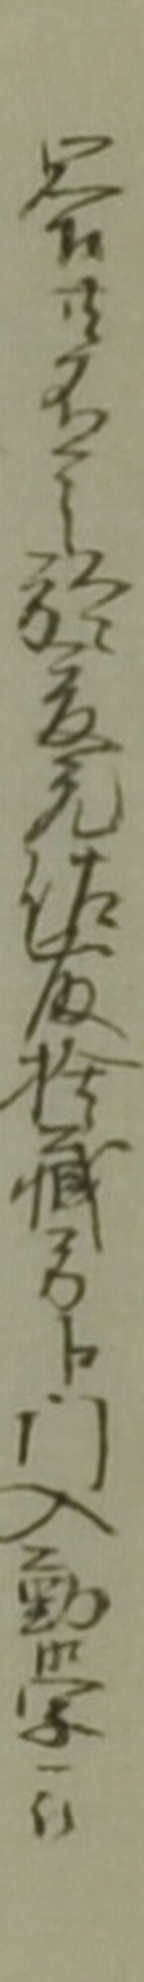思召共有之於爰元佐藤捨蔵方江門入勤学被

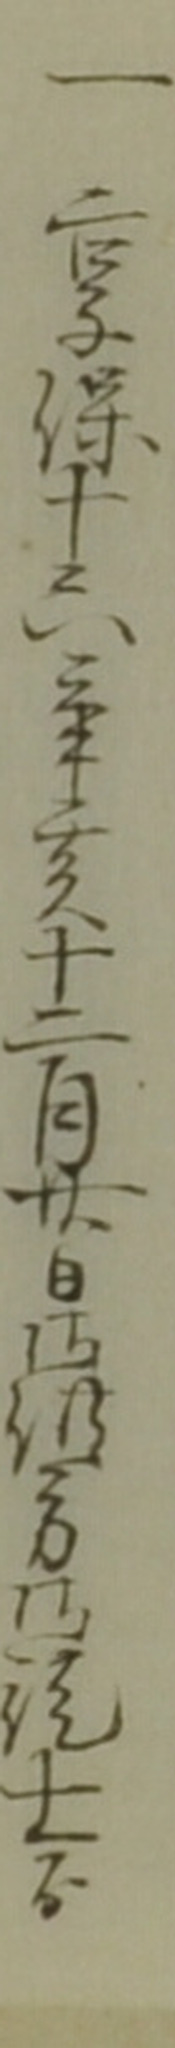一享保十六辛亥十二月廿日御供方御徒士ゟ
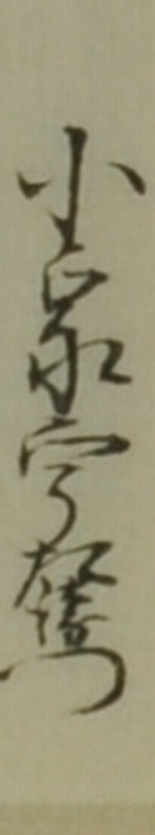小泉宇左衛門
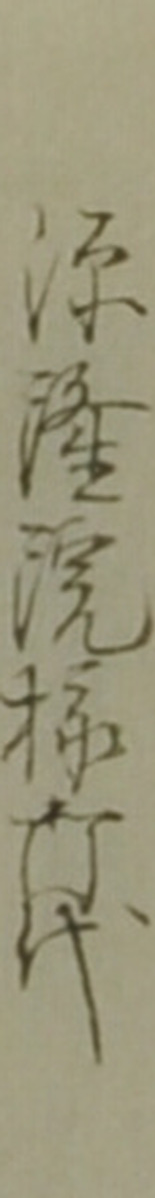源隆院様御代
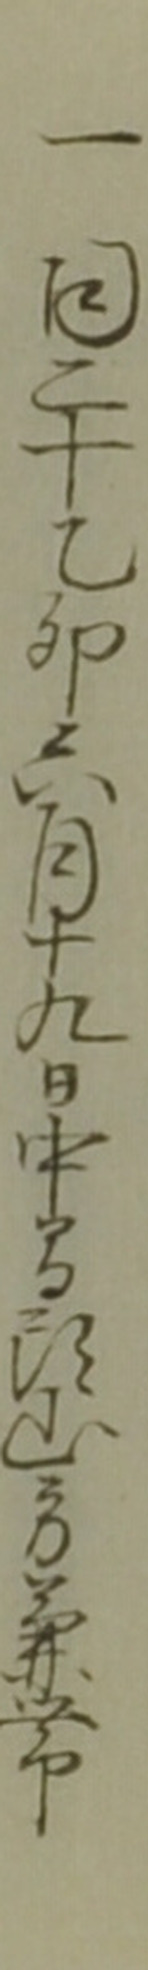一同二十乙卯六月十九日中間頭山方兼帯
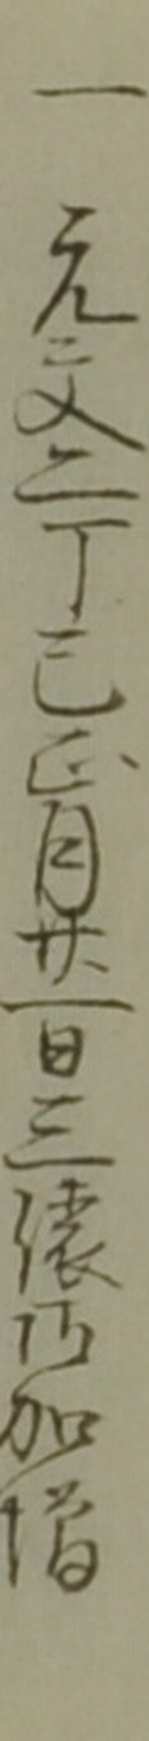一元文二丁巳正月廿一日三俵御加増
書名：無足諸士勤仕録（一）
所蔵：伊那市立高遠町図書館・合同会社AMANE
